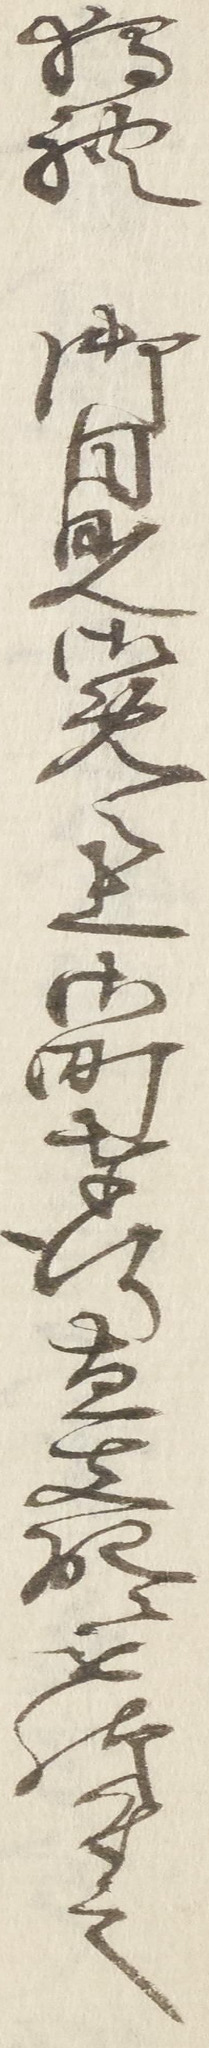独礼御目見御免之上御町奉行直支配に被仰付之
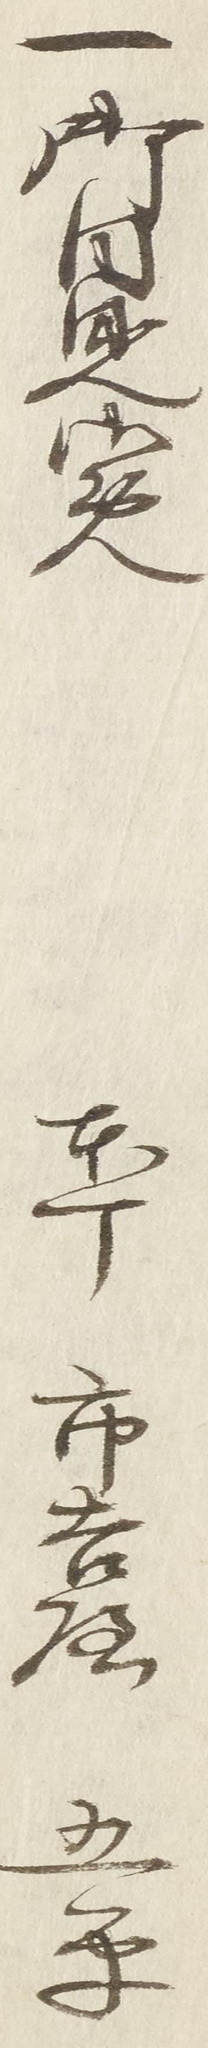一御目見御免本丁市吉屋五平
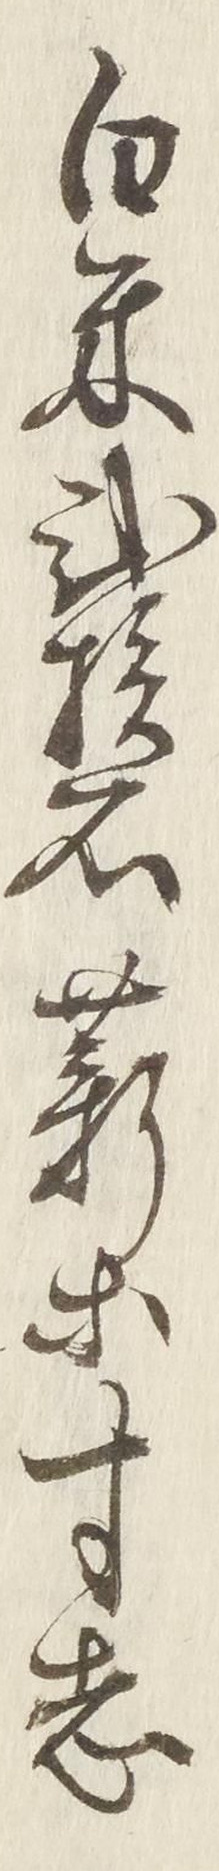白米弐拾石薪等寸志
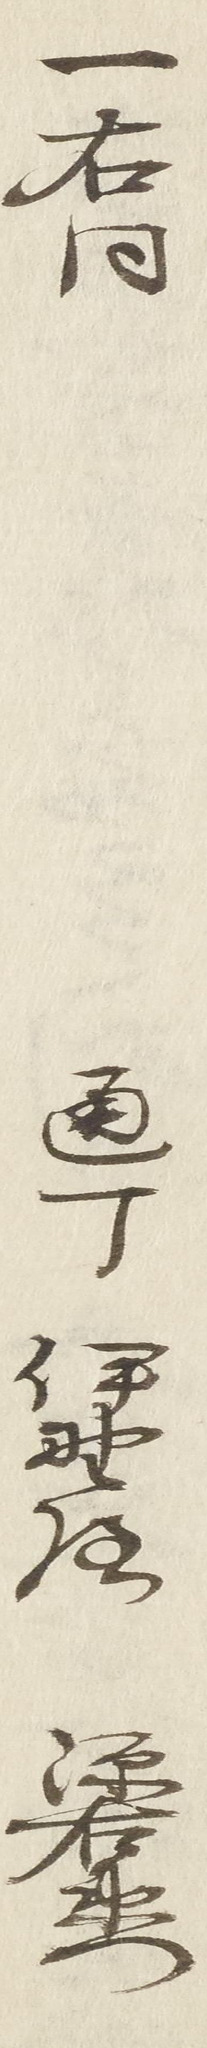一右同通丁伊野屋源右衛門
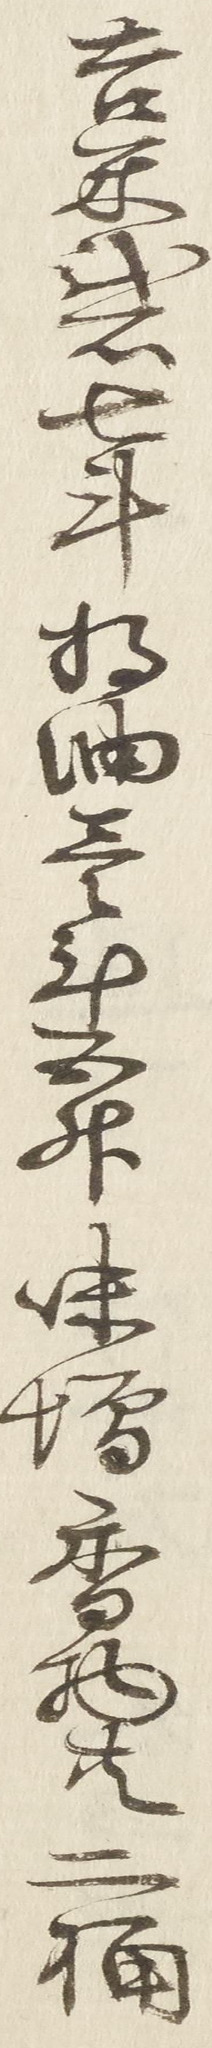吉米弐石七斗桐油壱斗五升味噌香物共二桶
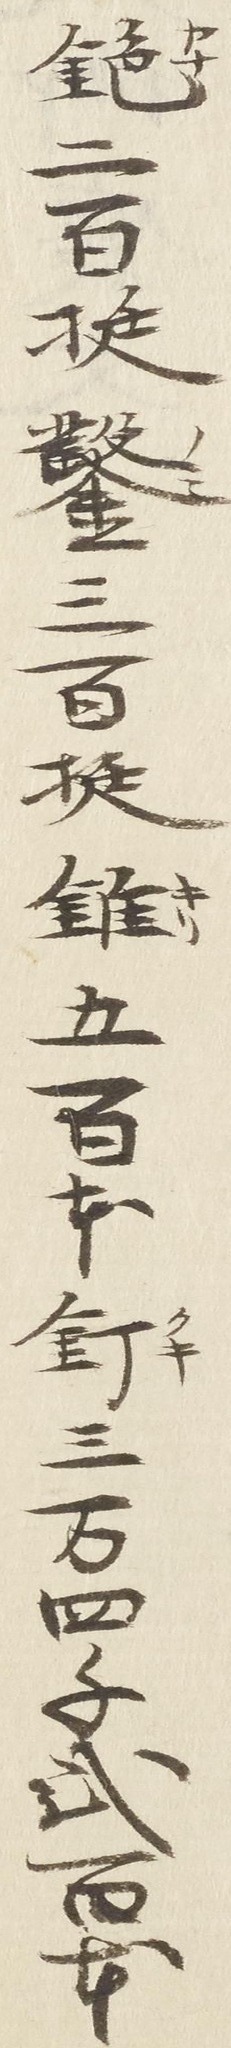鉋二百挺鑿三百挺錐五百本釘三万四千弐百本
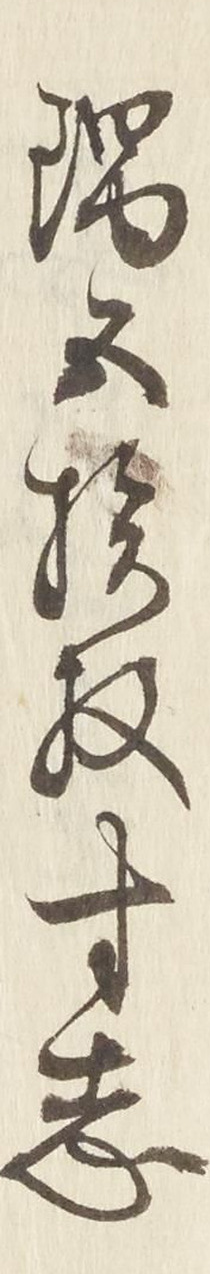鍋五拾枚寸志
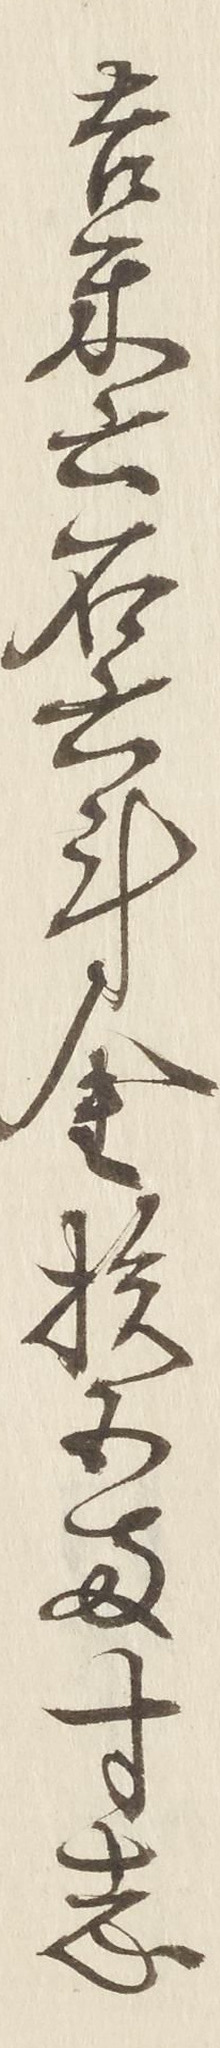吉米六石金拾五両寸志
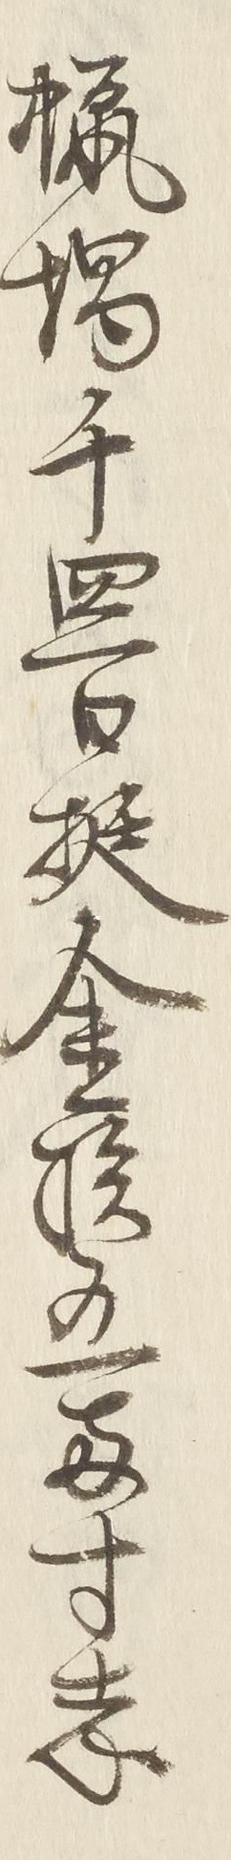蝋燭千四百挺金拾五両寸志
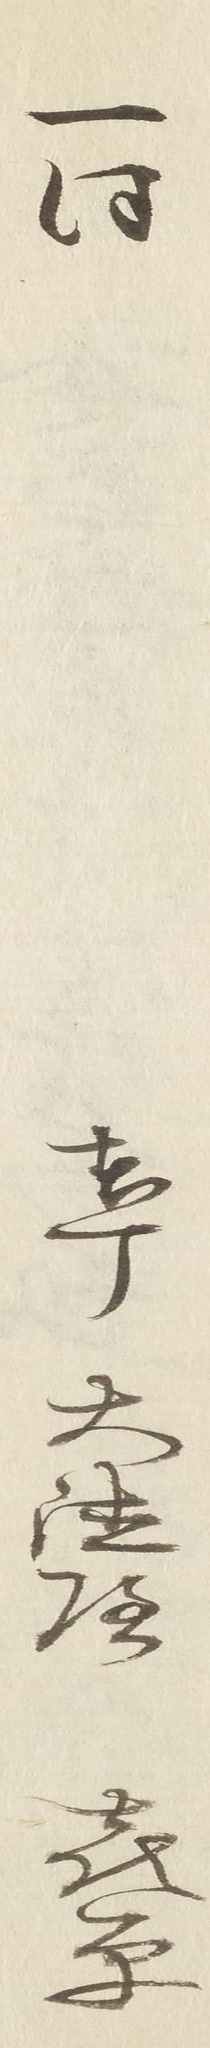一同本丁大徳屋喜平
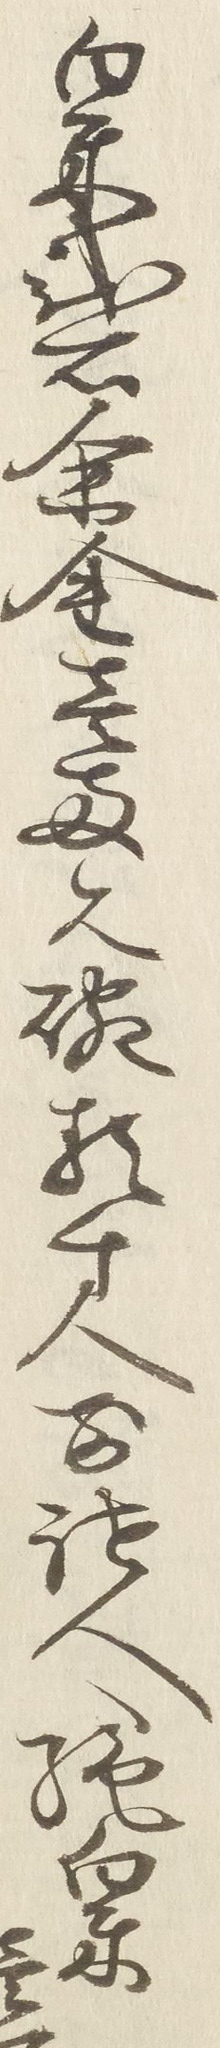白米弐石余金壱両大？碗類十人前諸人へ施白米壱石
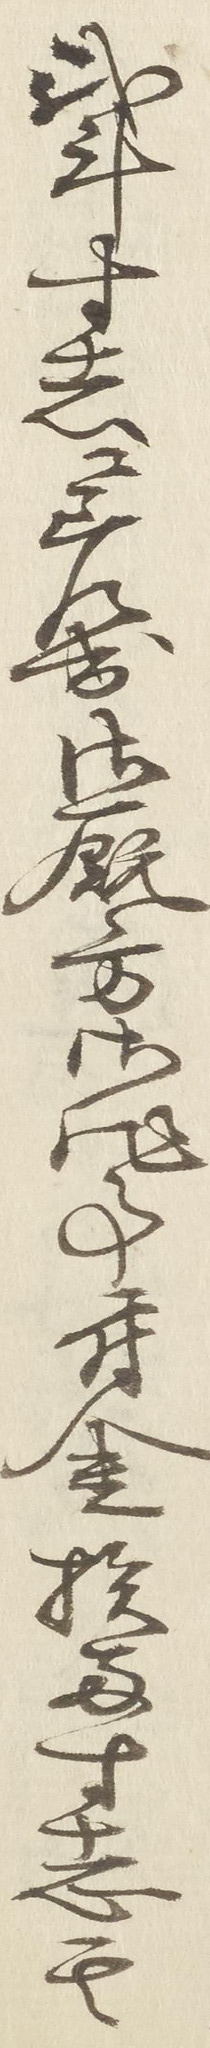弐斗寸志に差出御厩方御作事に付金拾両寸志其
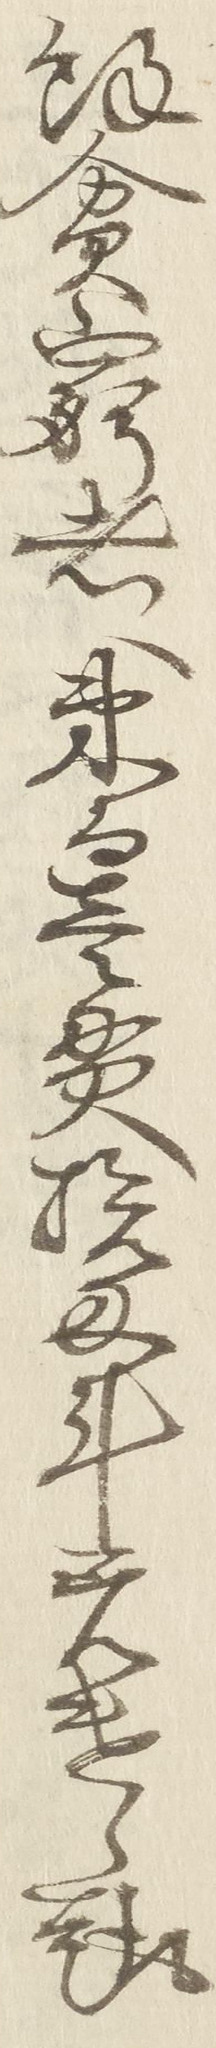餘貧窮者へ束而壱貫拾匁斗差遣候趣

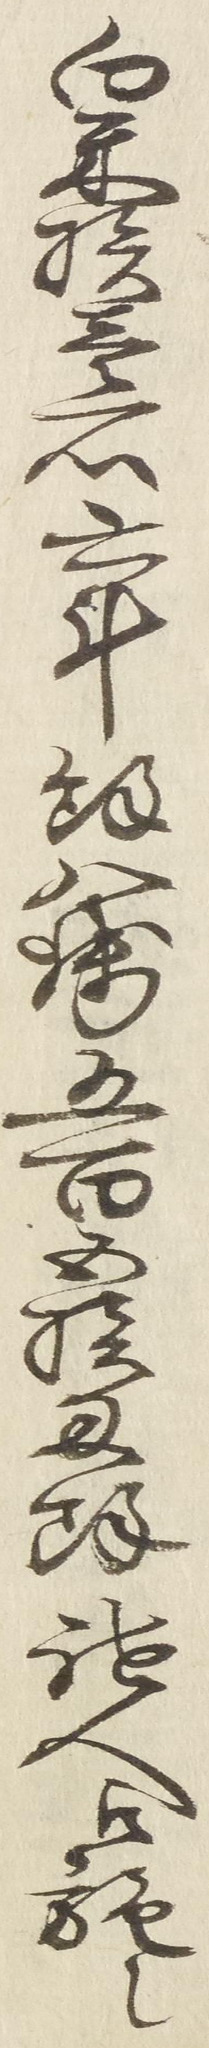白米拾壱石六斗餘八銭五百五拾両餘諸人江施し
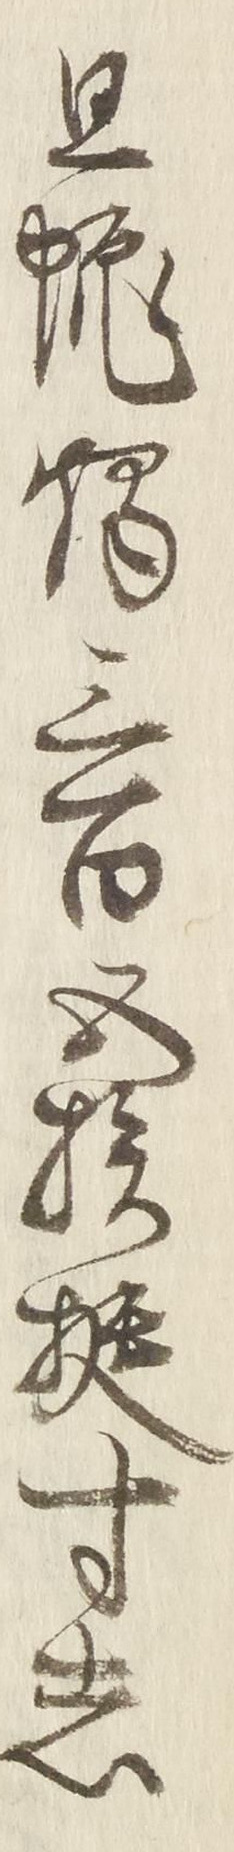且蝋燭三百五拾挺寸志
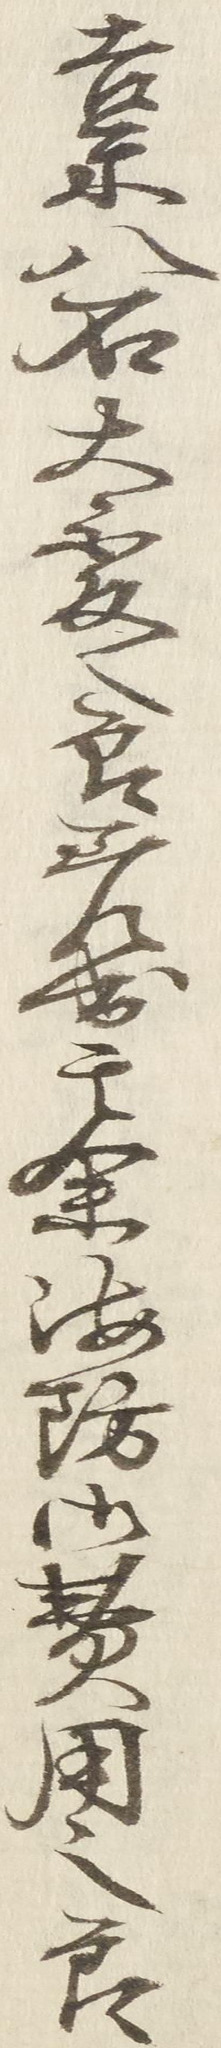吉米八石大変之節差出其余海防費用之節
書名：地震記　下
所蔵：東京大学地震研究所図書室 Earthquake Research Institute Library, The University of Tokyo, JAPAN
